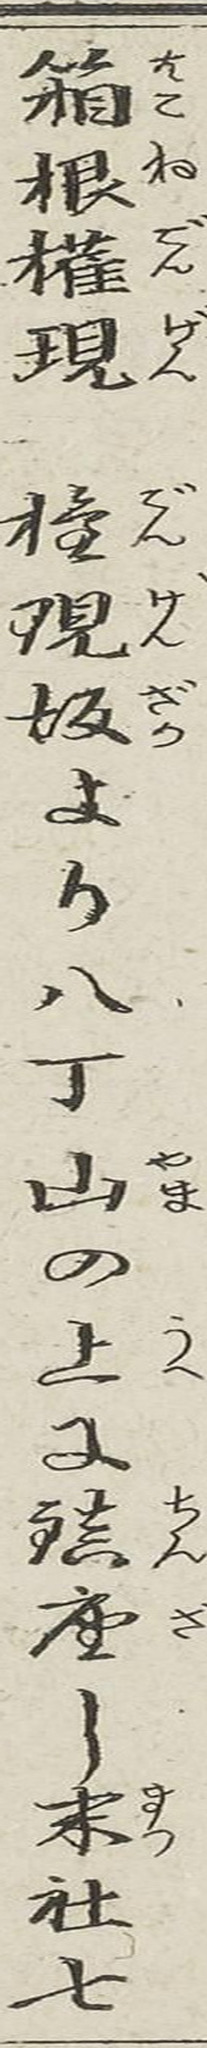箱根権現権現坂より八丁山の上に鎮座し末社七
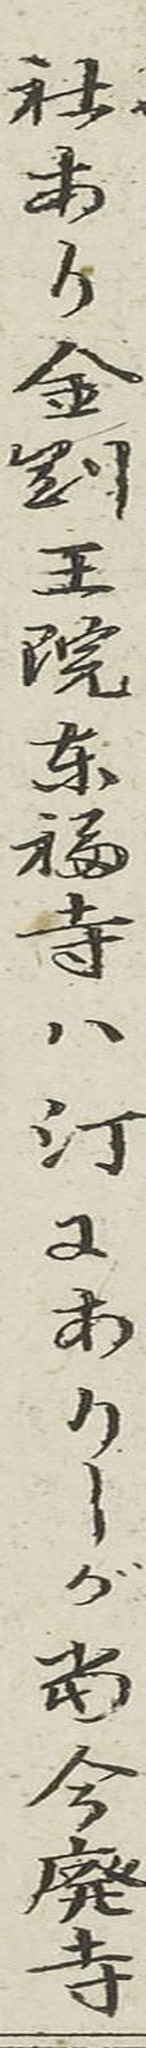社あり金剛王院東福寺は汀にありしが当今廃寺
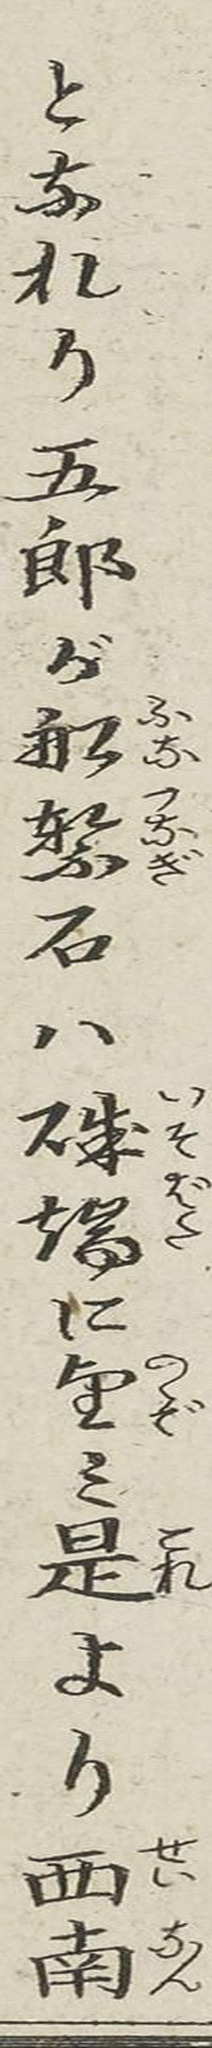となれり五郎が船繫石は磯場に望み是より西南

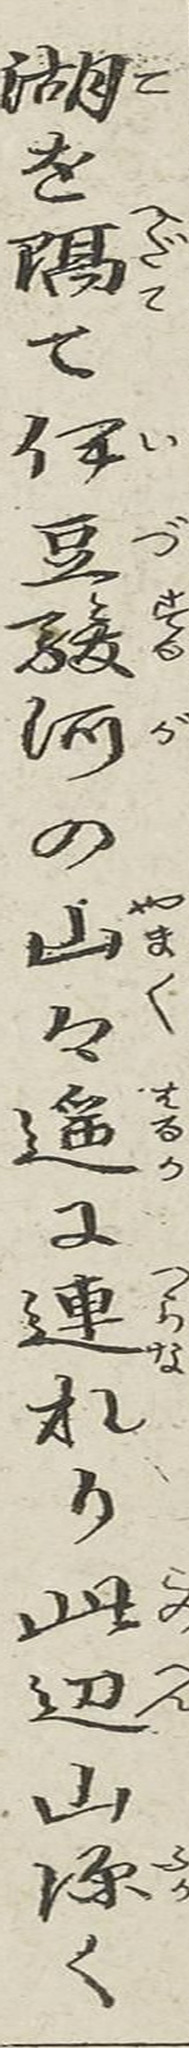湖を隔て伊豆駿河の山々遙に連れり此辺山深く
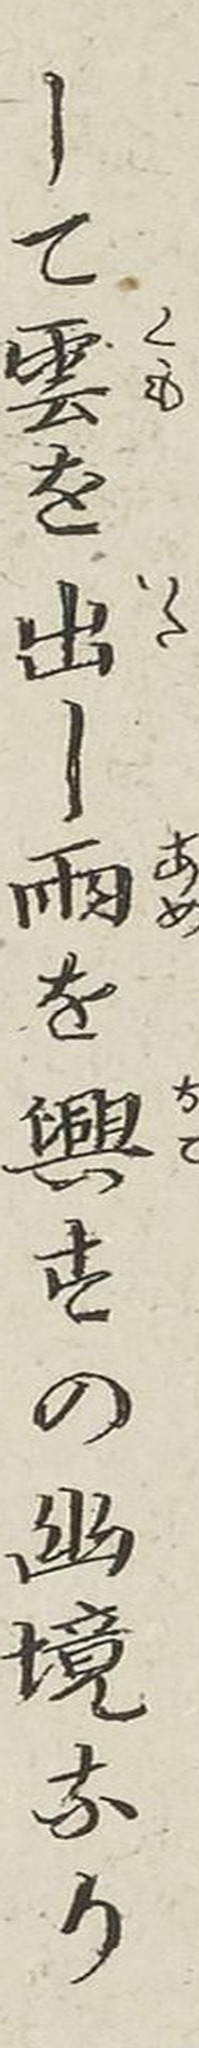して雲を出し雨を興すの幽境なり
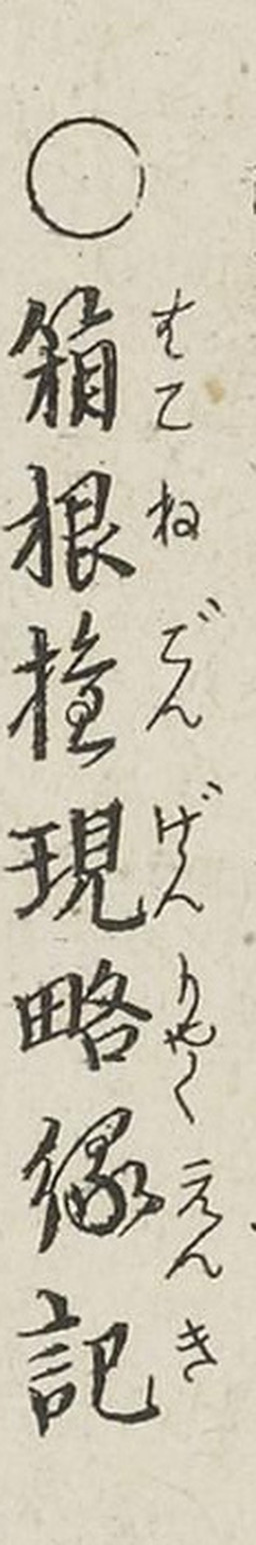○箱根権現略縁記
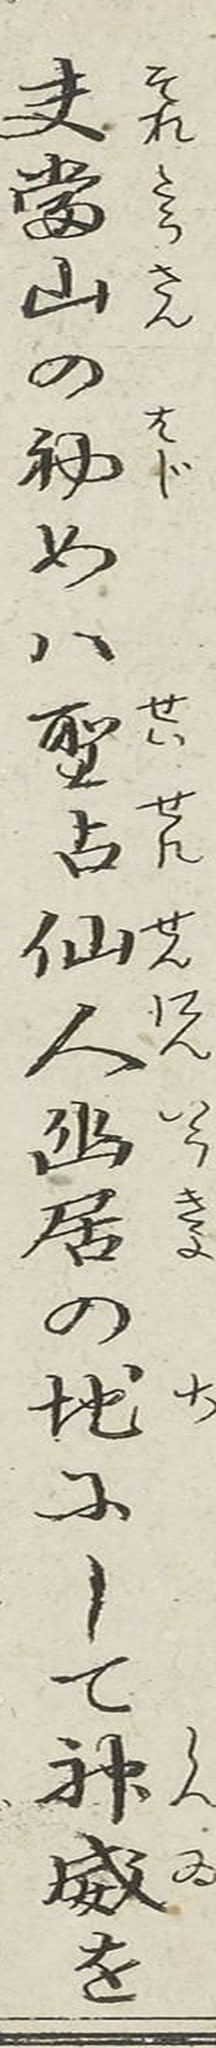夫當山の初めは聖占仙人幽居の地にして神威を
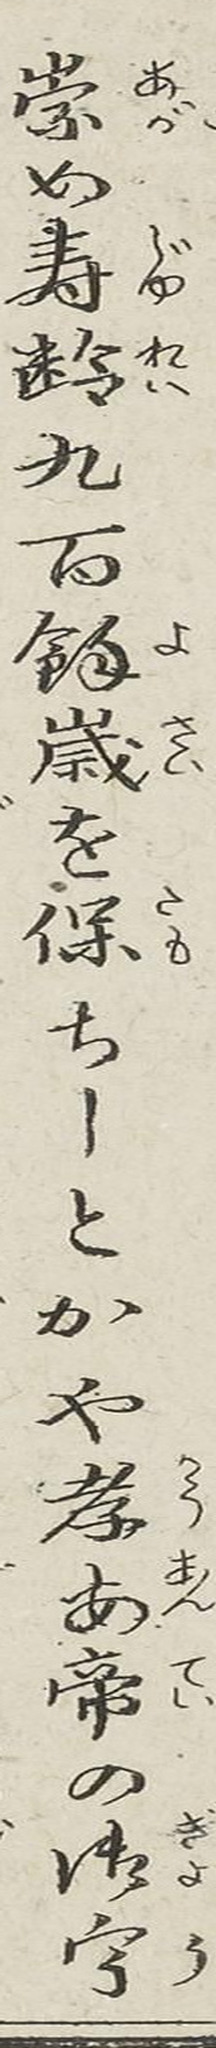崇め寿齢九百餘歳を保ちしとかや孝安帝の御宇
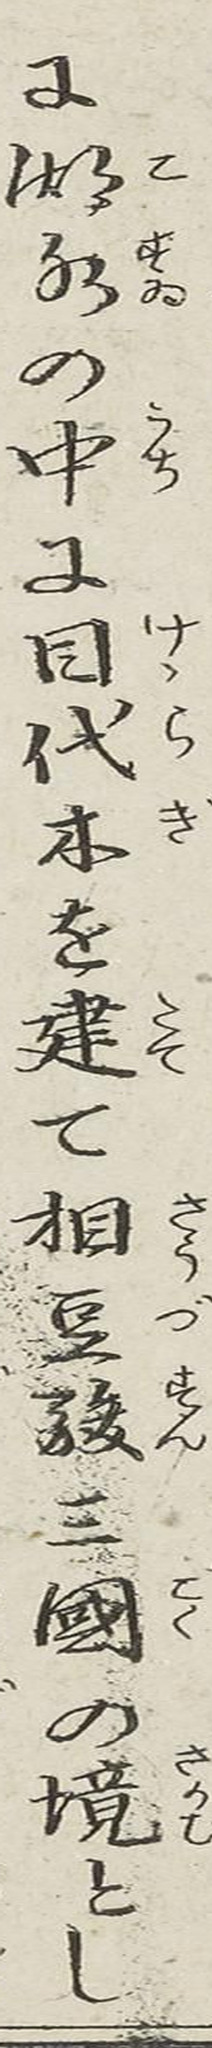に湖水の中に目代木を建て相豆駿三國の境とし
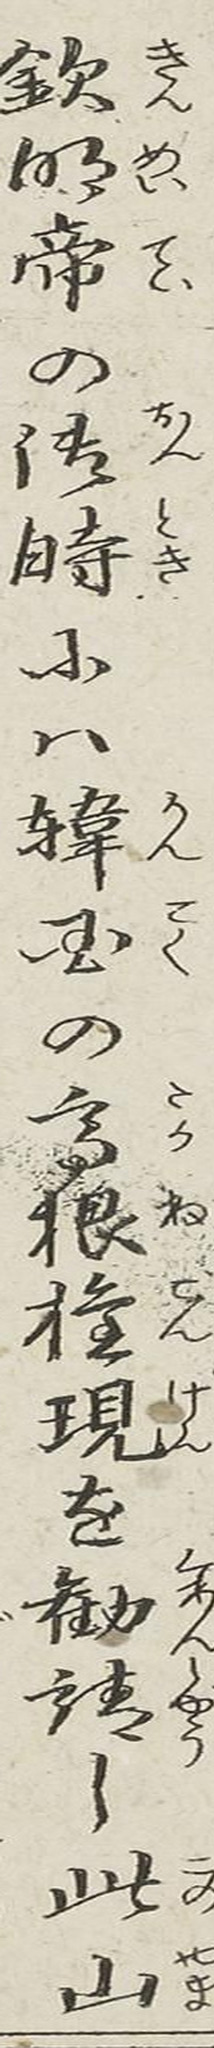欽明帝の御時には韓国の高根権現を勧請し此山
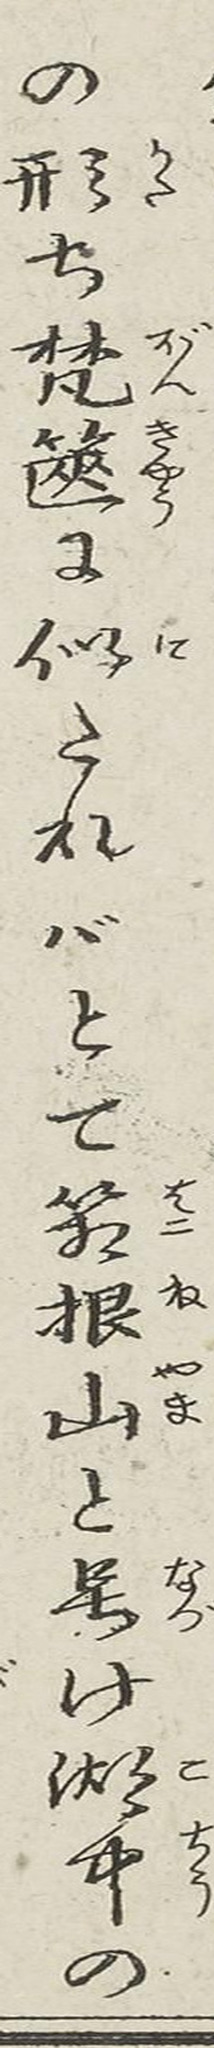の形ち梵篋に似たればとて箱根山と号け湖中の
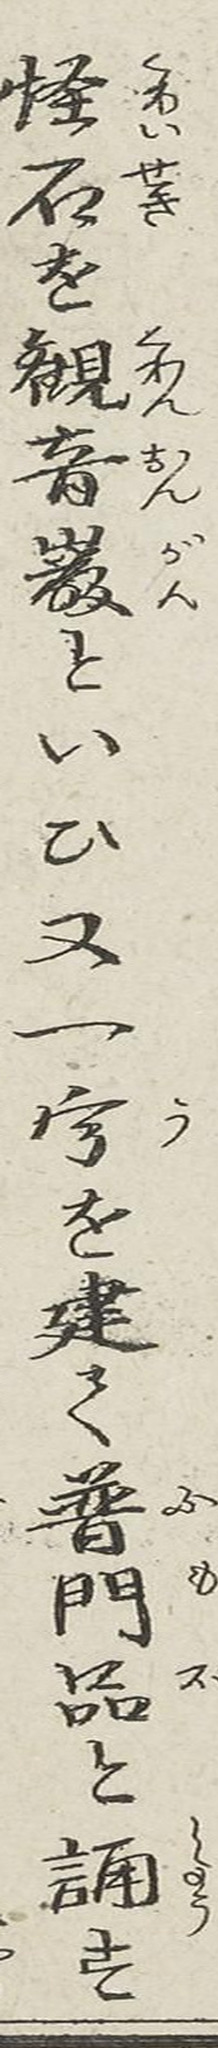怪石を観音巌といひ又一宇を建て普門品と誦す
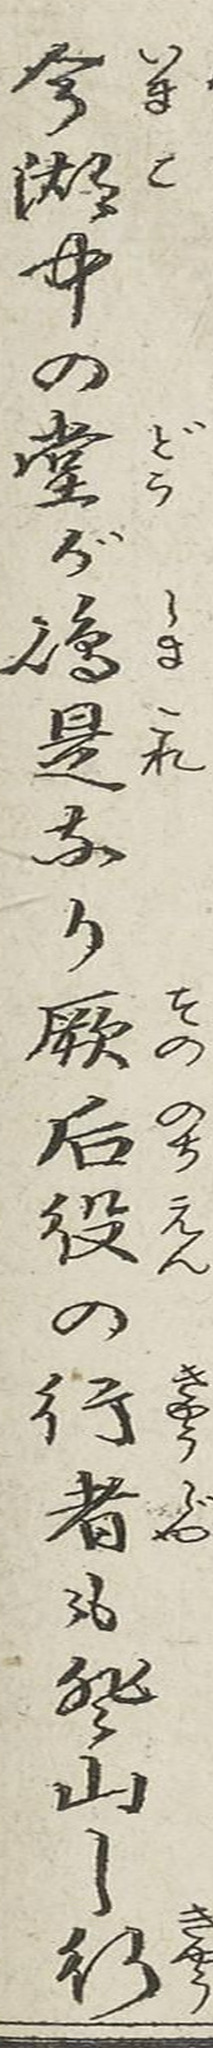今湖中の堂が嶋是なり厥后役の行者も登山し行
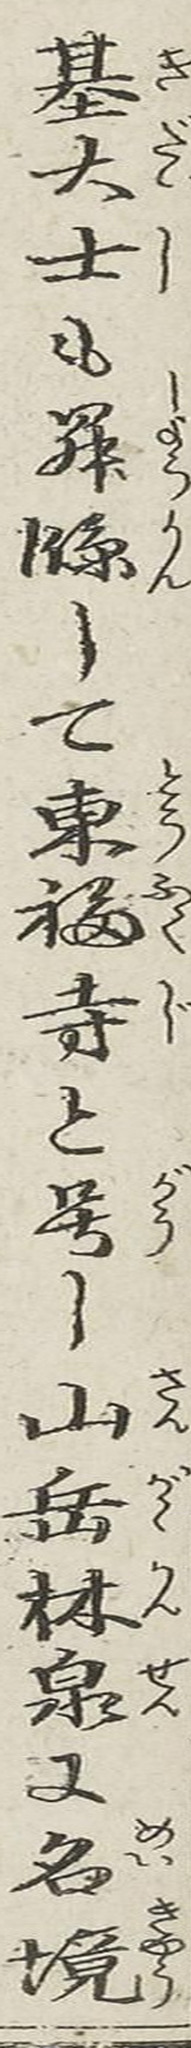基大士も昇降して東福寺と号し山岳林泉に名境
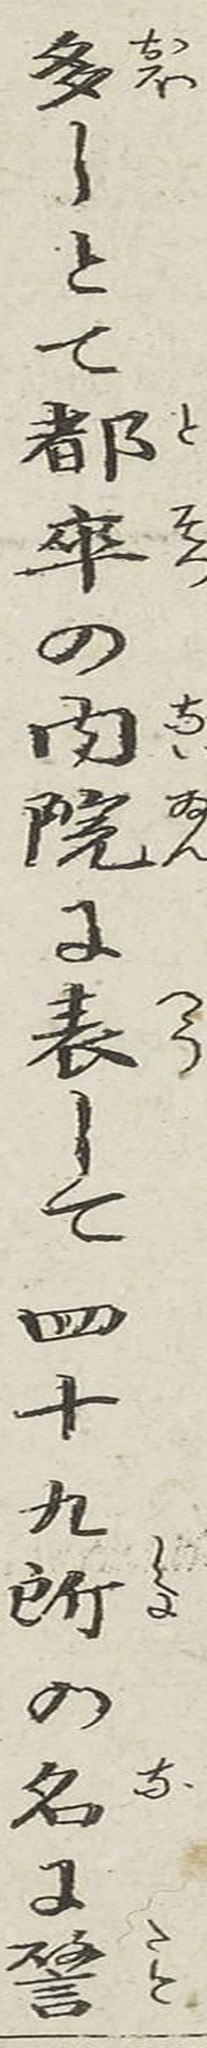多しとて都卒の内院に表して四十九所の名に譬
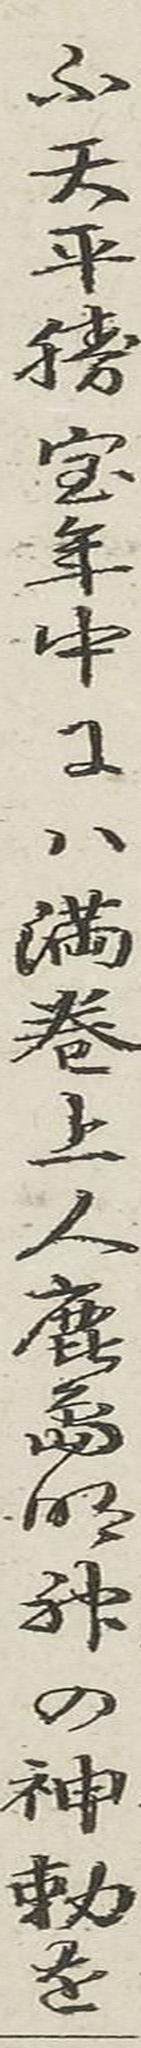ふ天平勝宝年中には満巻上人鹿島明神の神勅を
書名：箱根温泉誌　全
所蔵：東京大学地震研究所図書室 Earthquake Research Institute Library, The University of Tokyo, JAPAN
